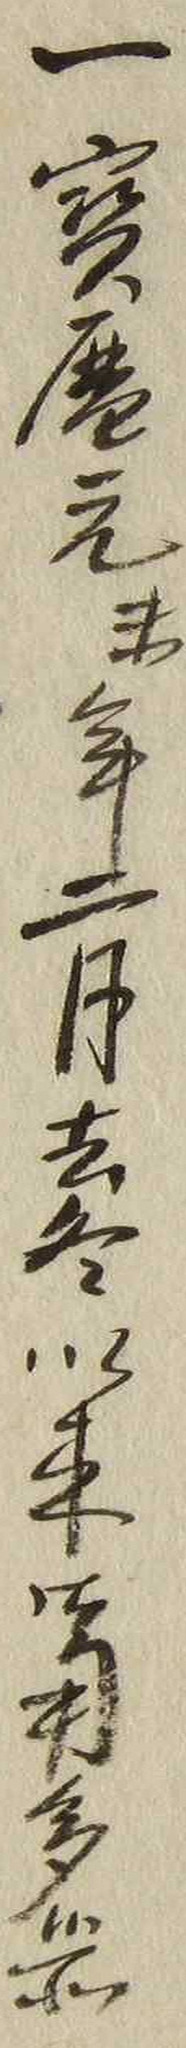一宝暦元未年二月去冬以来御用多候所
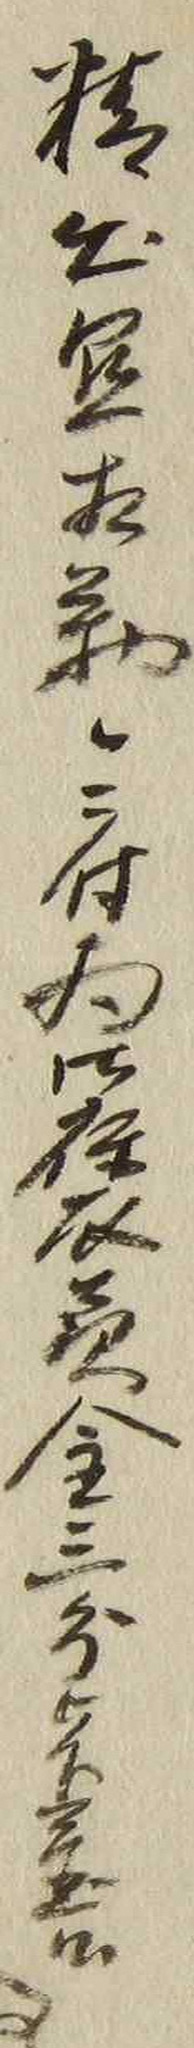精出宜相勤候ニ付為御褒美金三分被下置候事
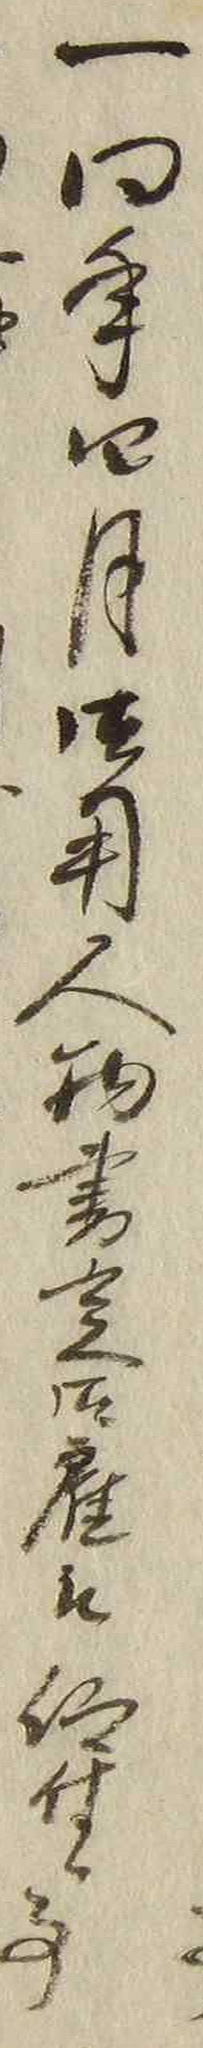一同年四月御用人物書定御雇被仰付候事
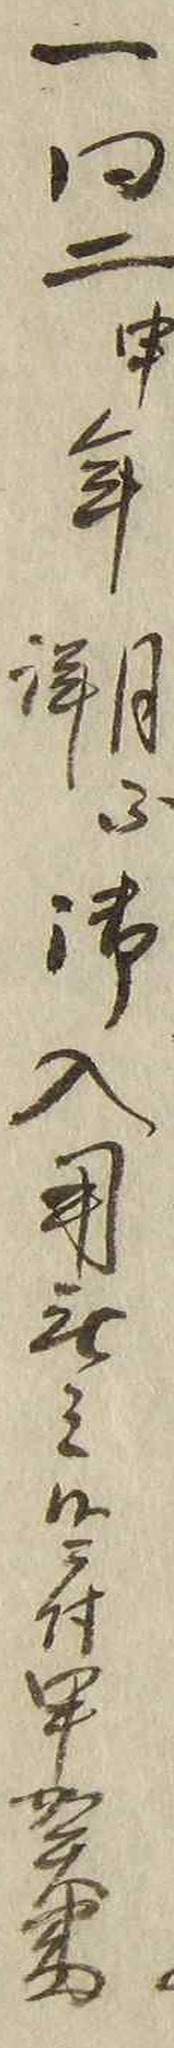一同二申年月不詳御入用無之候ニ付甲賀番

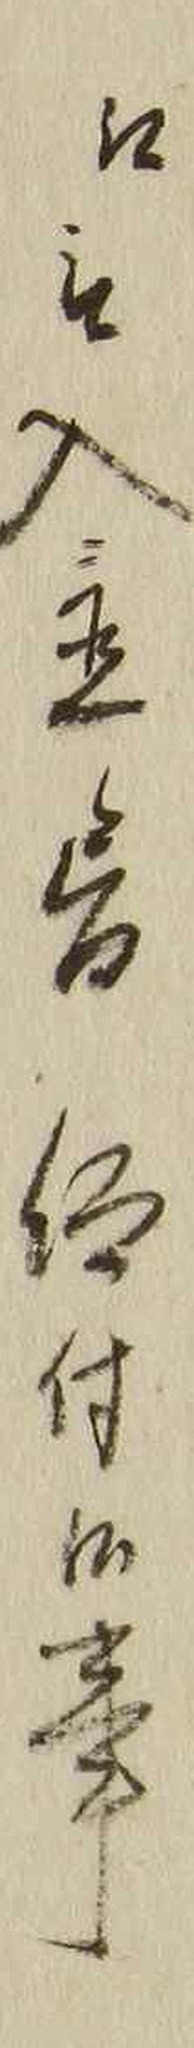江被入置候旨仰付候事
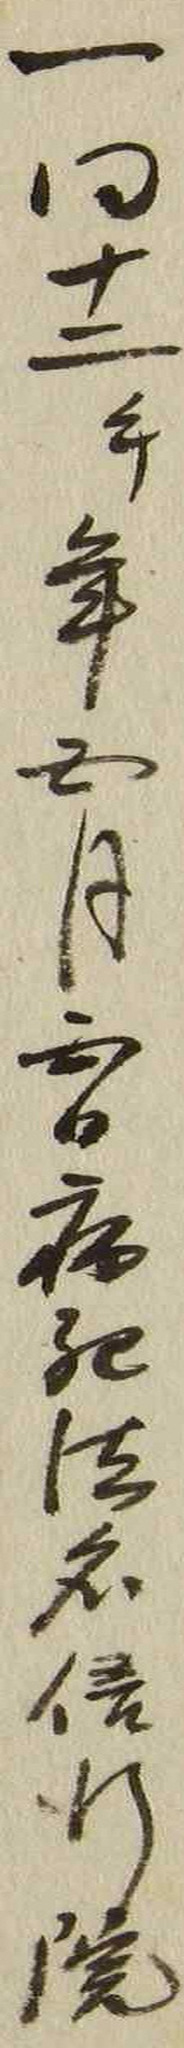一同十二午年五月五日病死法名信行院
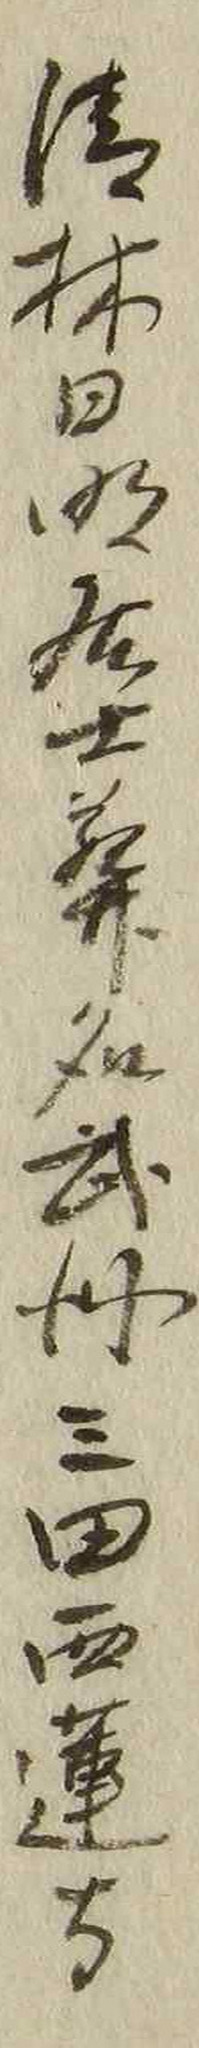清林日明居士葬処武州三田西蓮寺
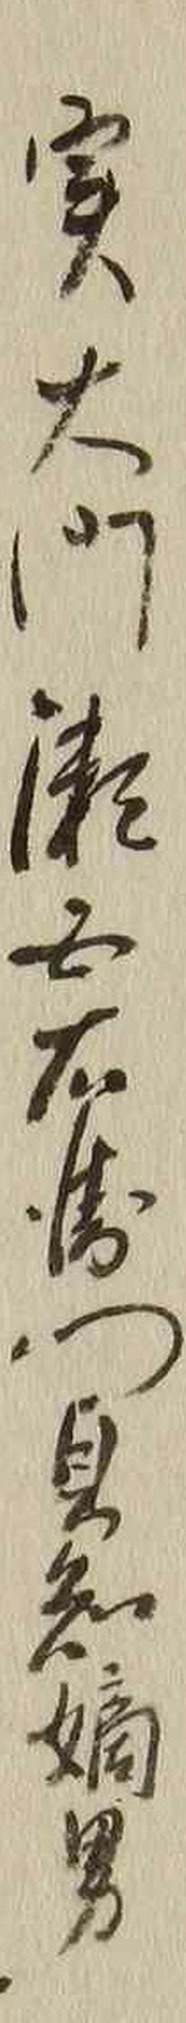実大門瀬五右衛門貞知嫡男
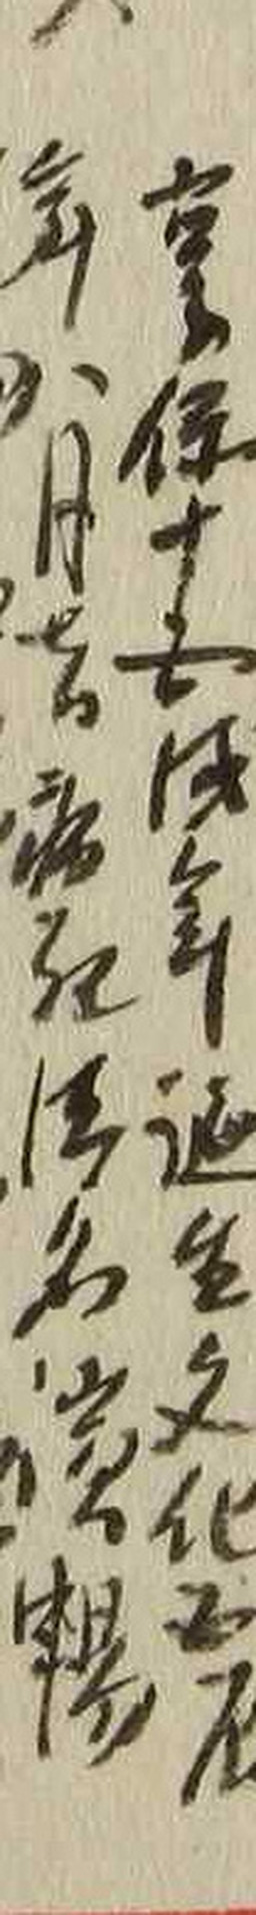年八月七日病死法名演暢
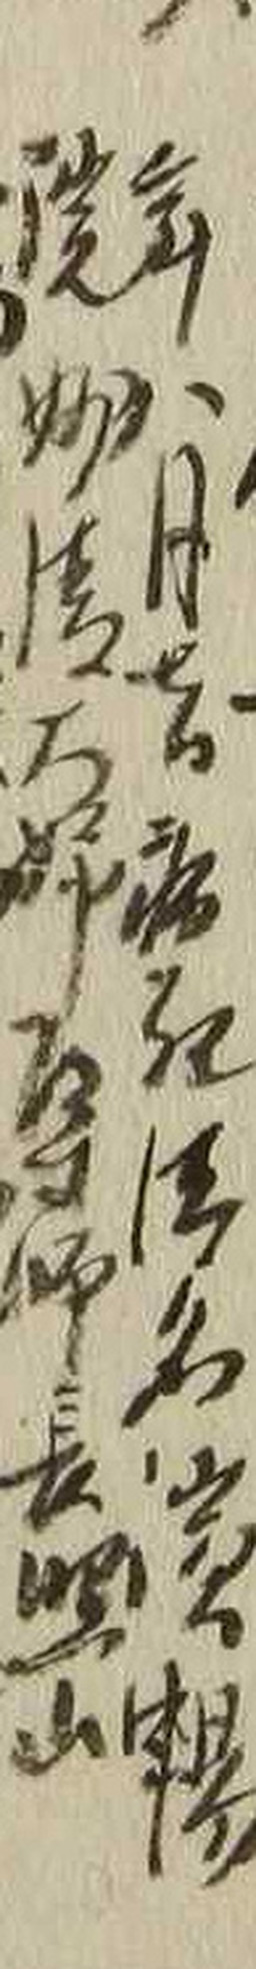院妙清大姉導師長照山
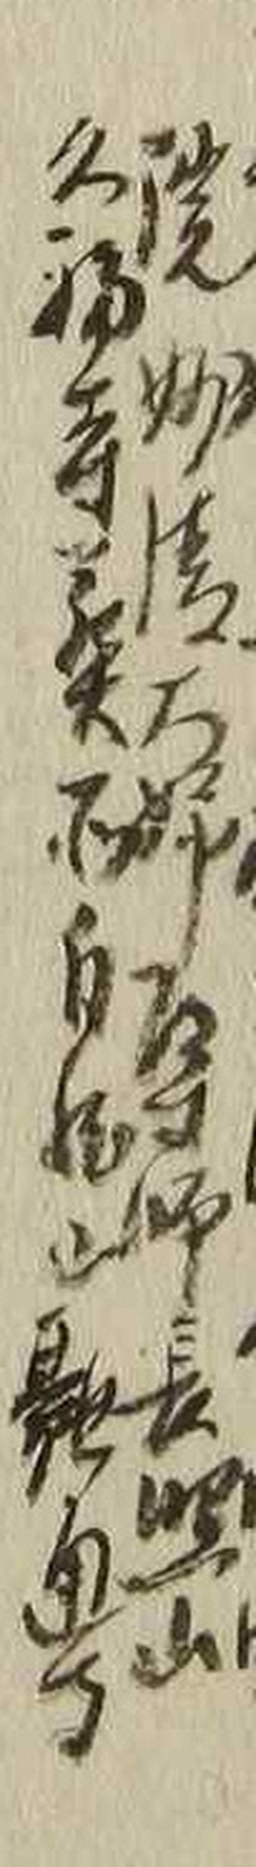久福寺葬所白龍山融通寺
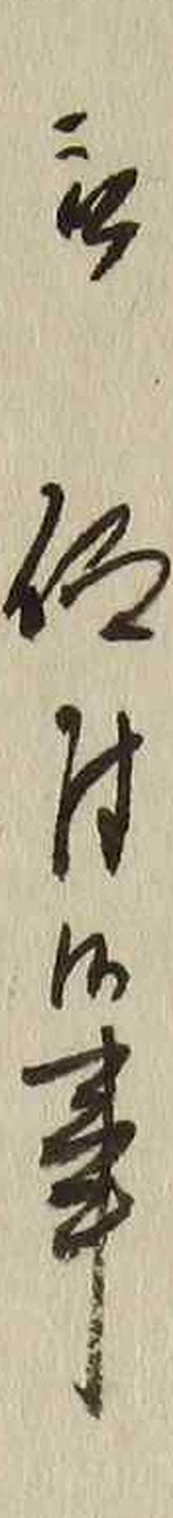被仰付候事
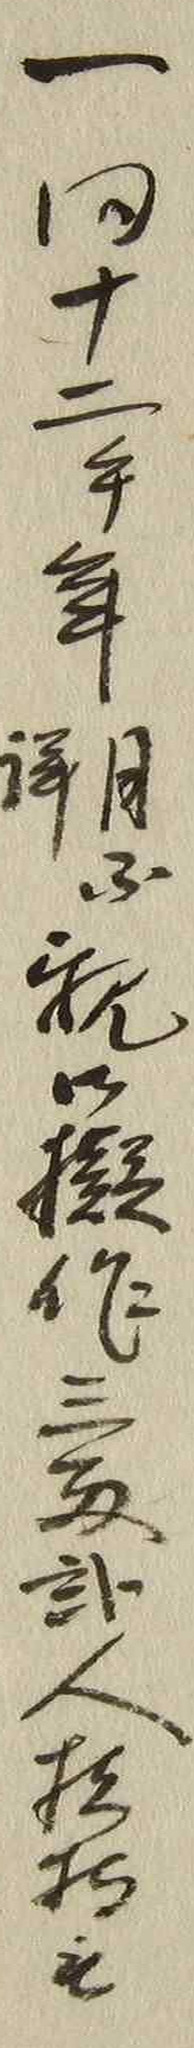一同十二午年月不詳親御擬作三両弐人扶持被
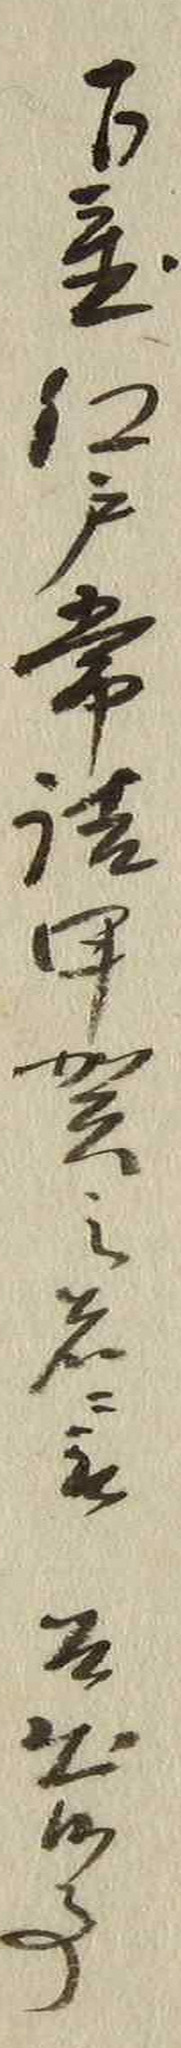下置江戸常詰甲賀之者ニ被召出候事
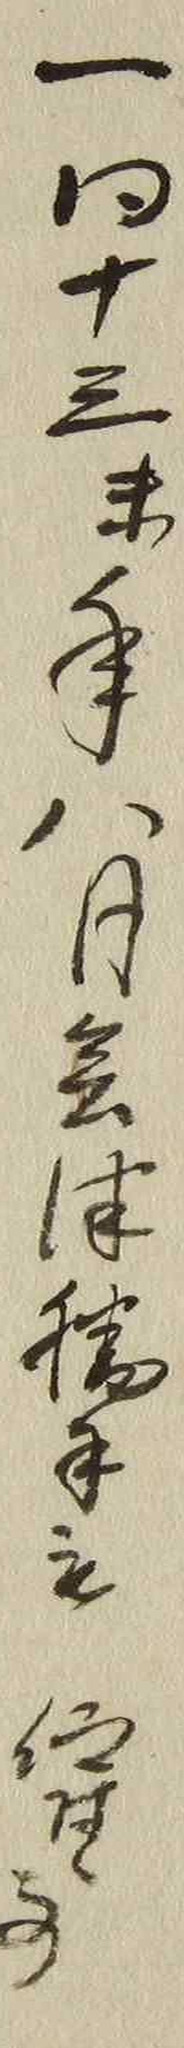一同十三未年八月会津勝手被仰付候事
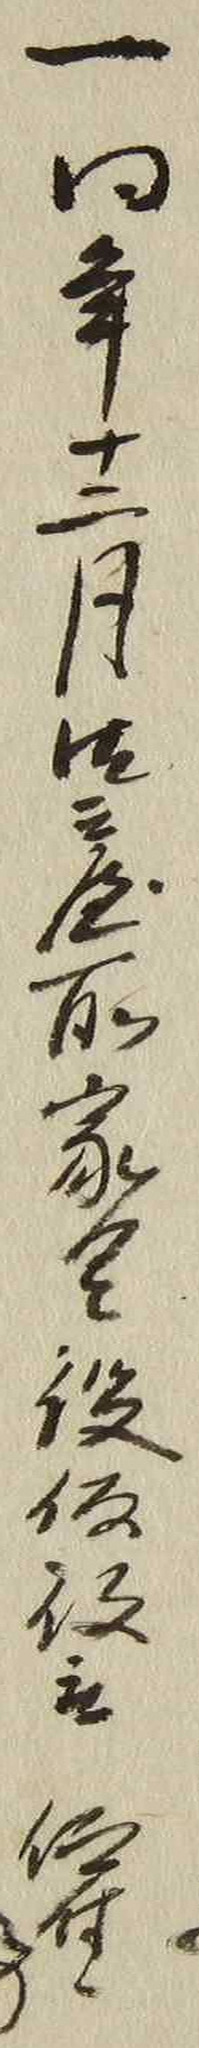一同年十二月御台所家具役仮役被仰付候事
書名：諸士系譜　巻之360　す之部10
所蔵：会津若松市立会津図書館
